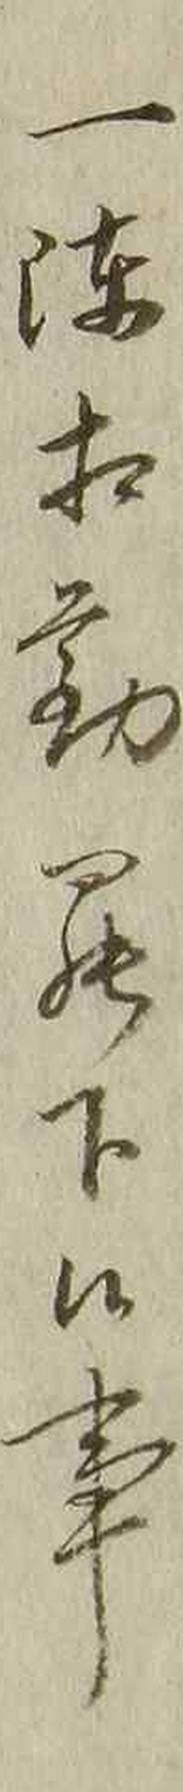一陣相勤罷下候事
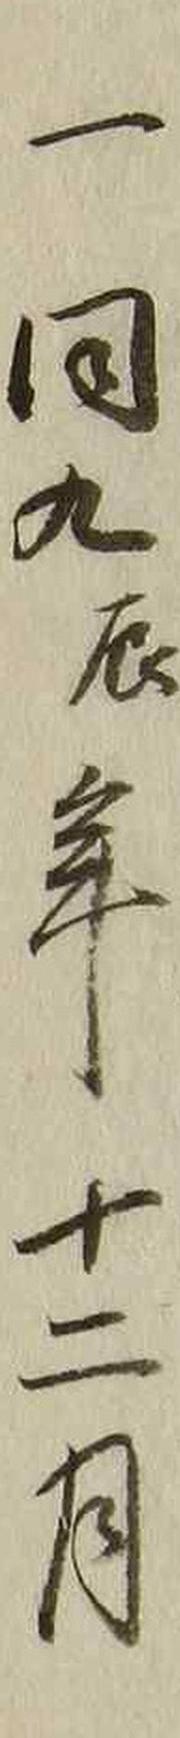一同九辰年十二月
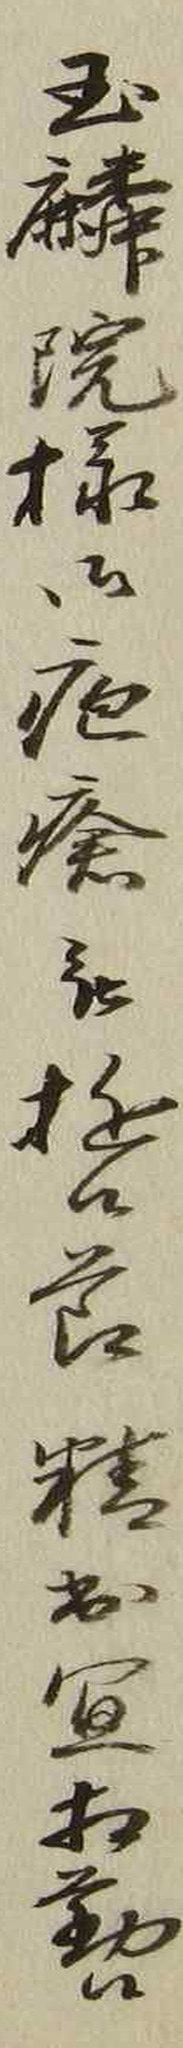玉麟院様御庖瘡被遊候節精出宜相勤候
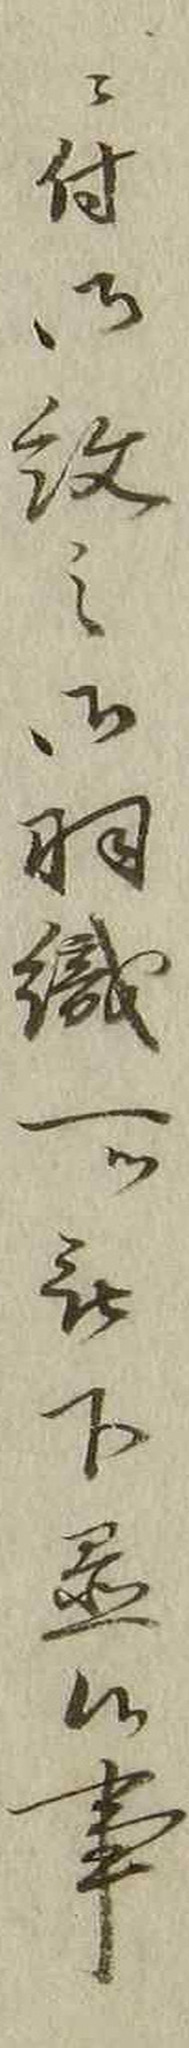に付御紋之御羽織一つ被下置候事
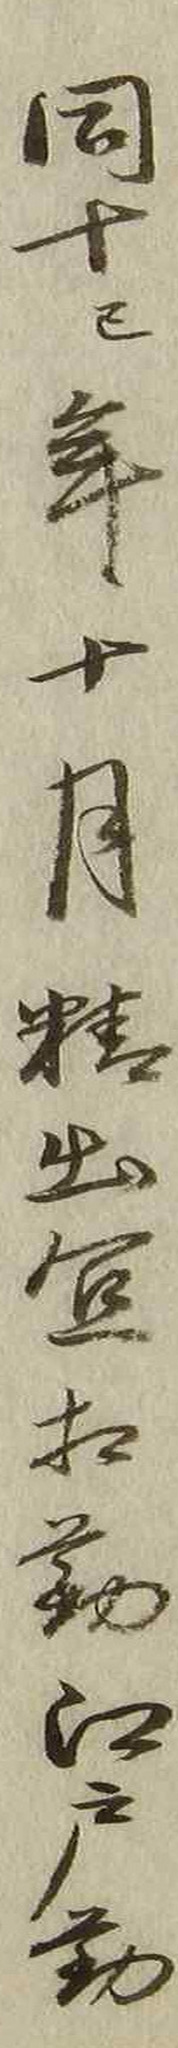一同十巳年十月精出宜相勤江戸勤
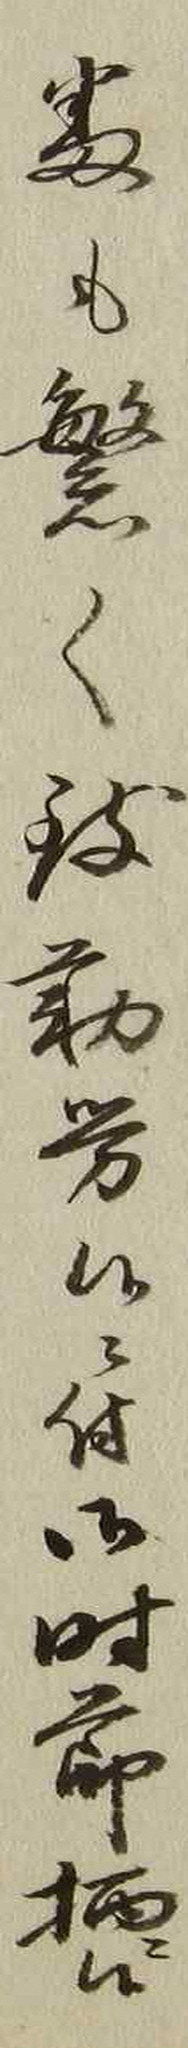番も繁く致勤労候に付御時節柄に候
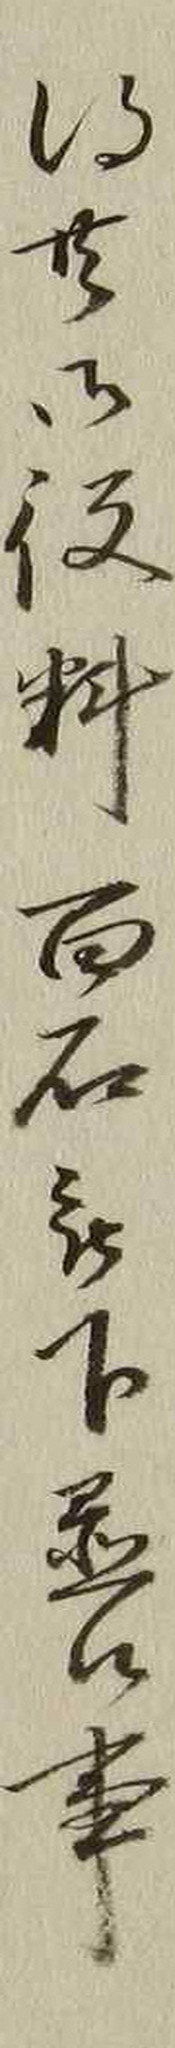得共御役料百石被下置候事
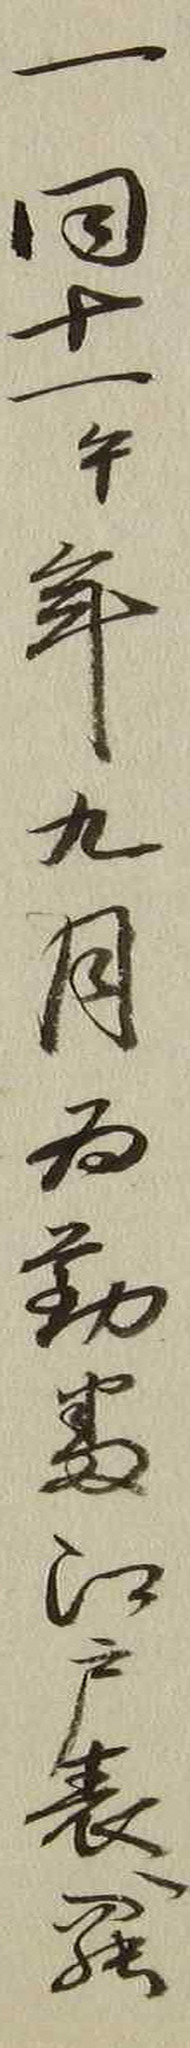一同十一午年九月為勤番江戸表へ罷
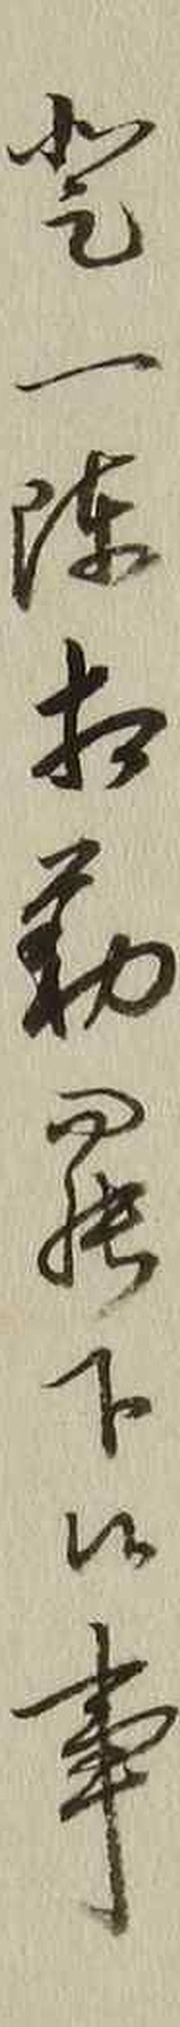登一陣相勤罷下候事
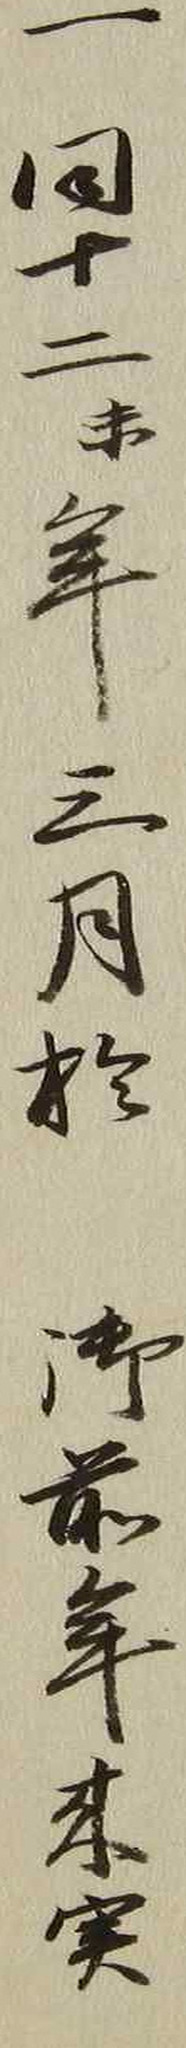一同十二末年三月於御前年来実
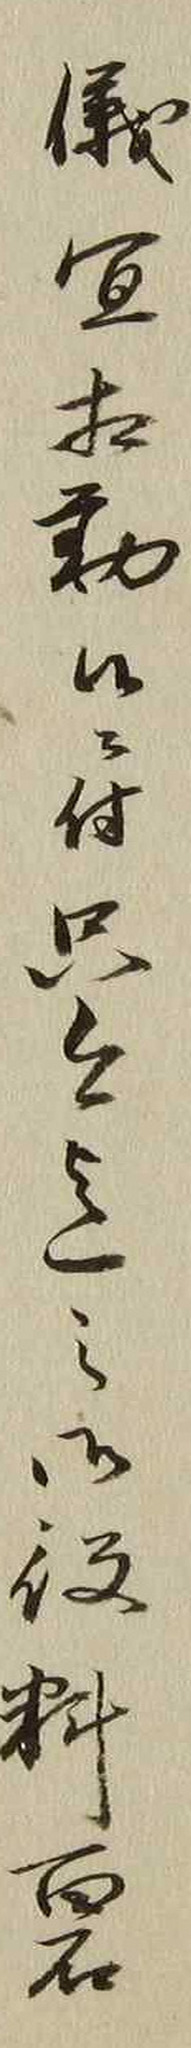儀宜相勤候にニ付只今迄之御役料百石
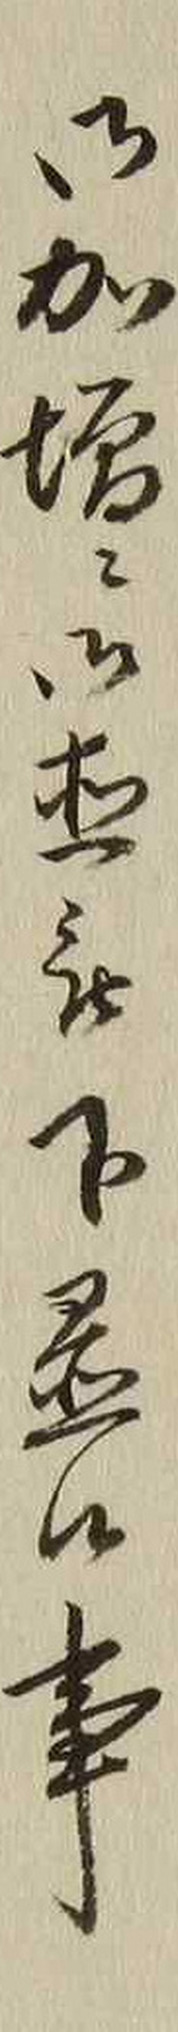御加増に御直被下置候事
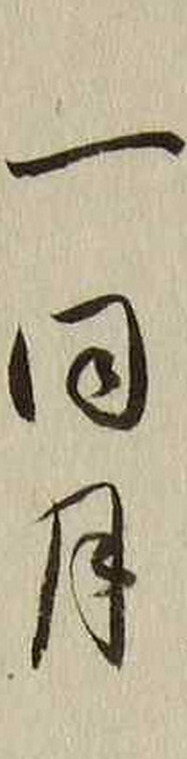一同月
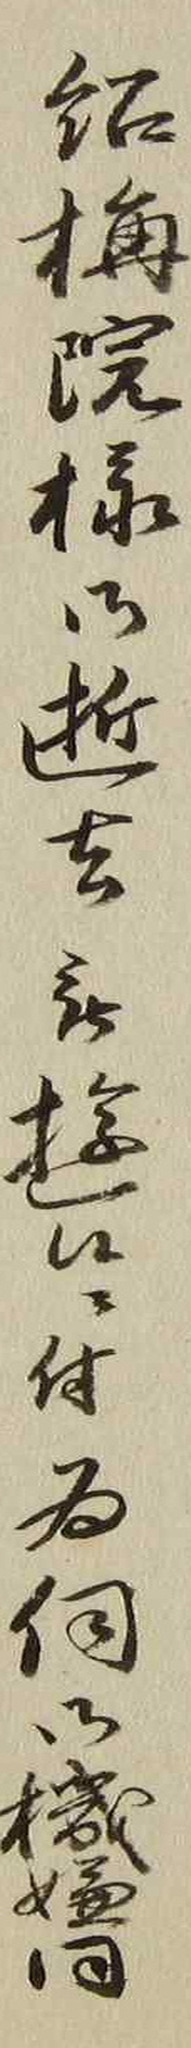紹称院様御逝去被遊候に付為伺御機嫌同
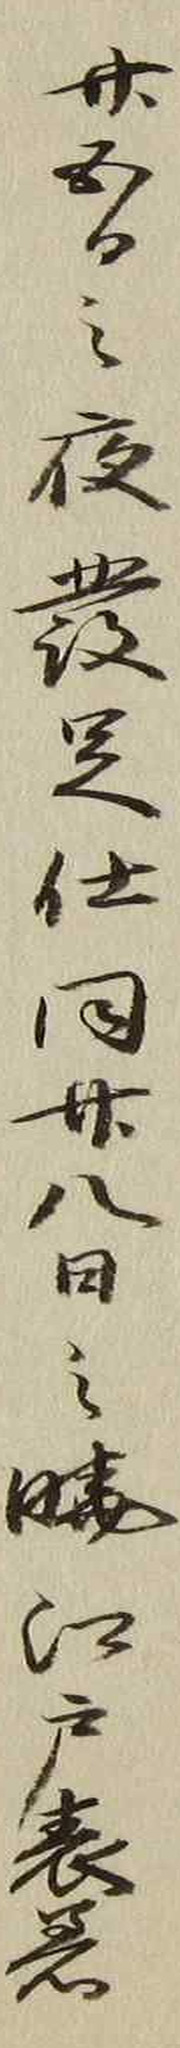廿五日之夜発足仕同廿八日之暁江戸表着
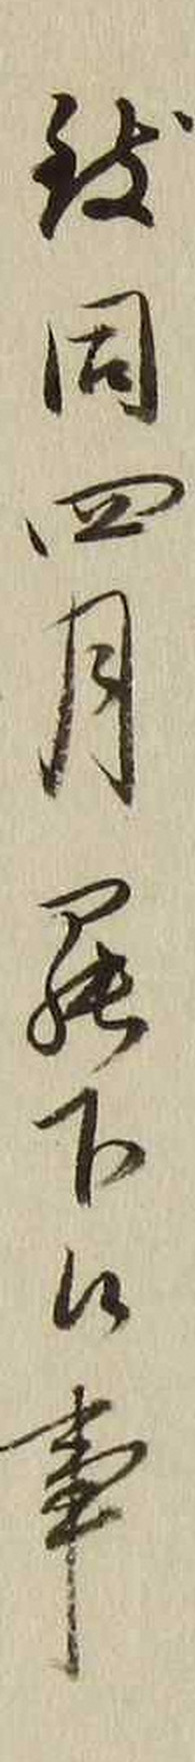致同四月罷下候事
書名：諸士系譜　巻之133　た之部9
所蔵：会津若松市立会津図書館
